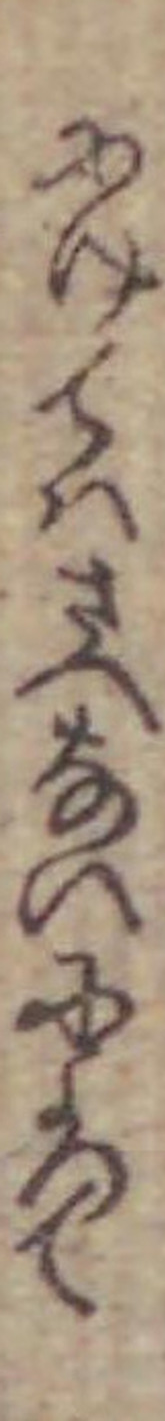にけてはさへないによつて
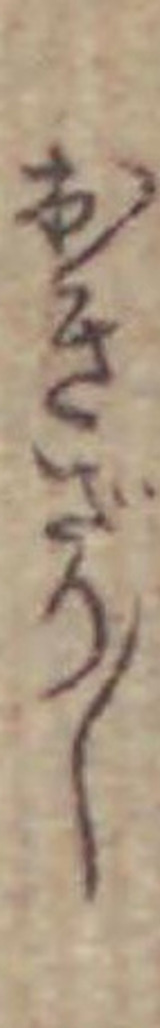おきざりにて
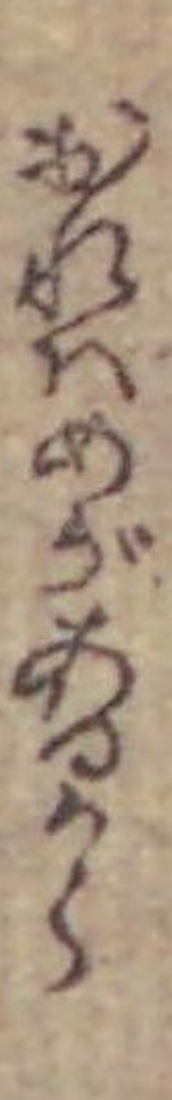おれはめがあるから
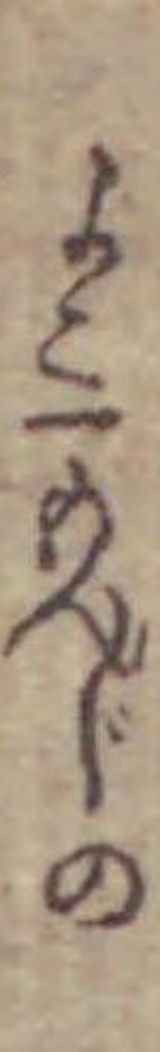よこ一もんじの
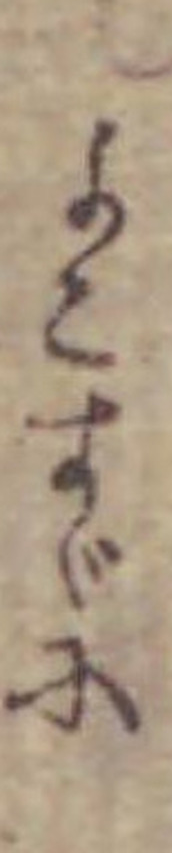よこすじに
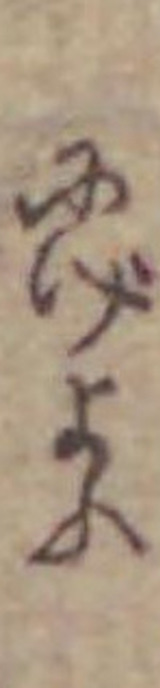にげよふ
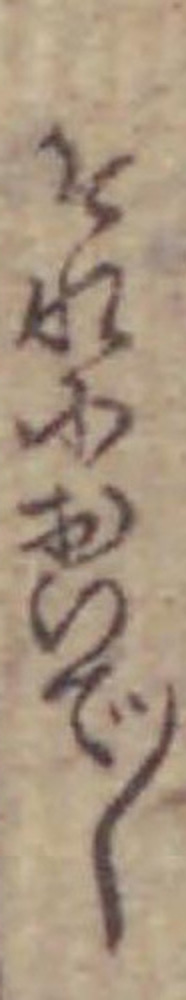それにおいで〱

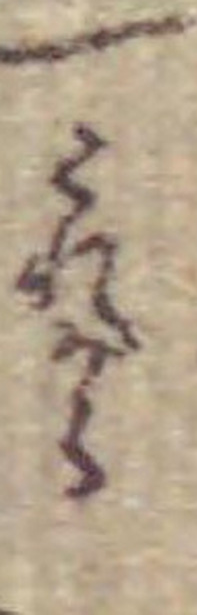これから
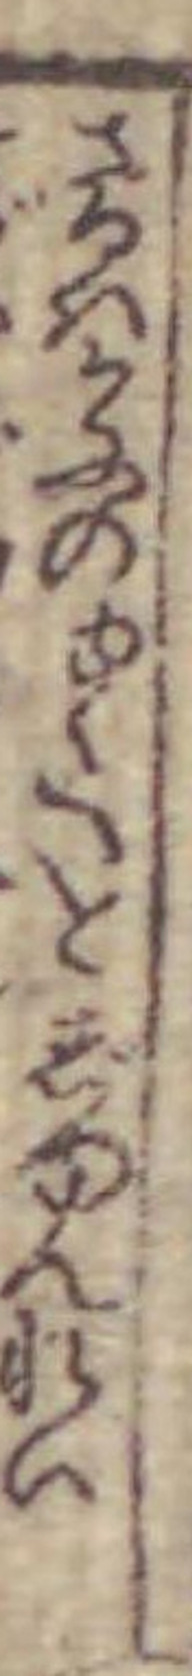さるはかにのゆくへをじゆんれい
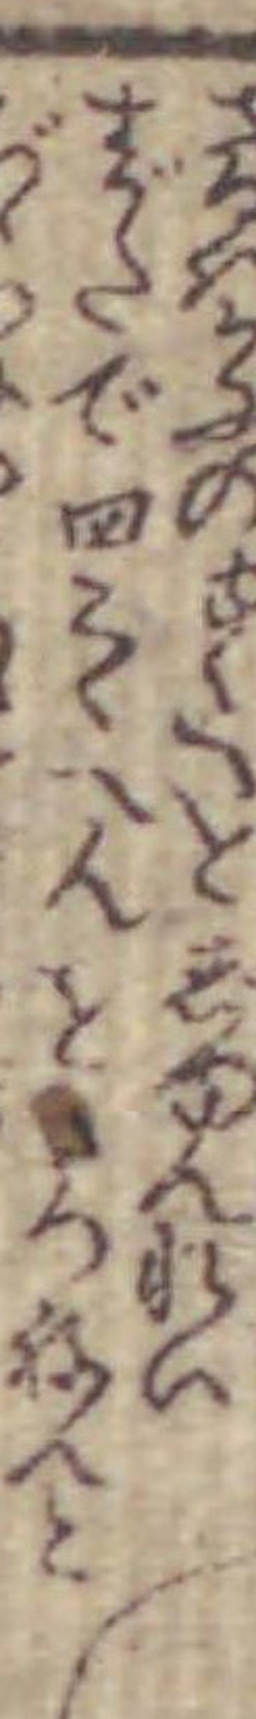すがたで四こくへんをたつねんと
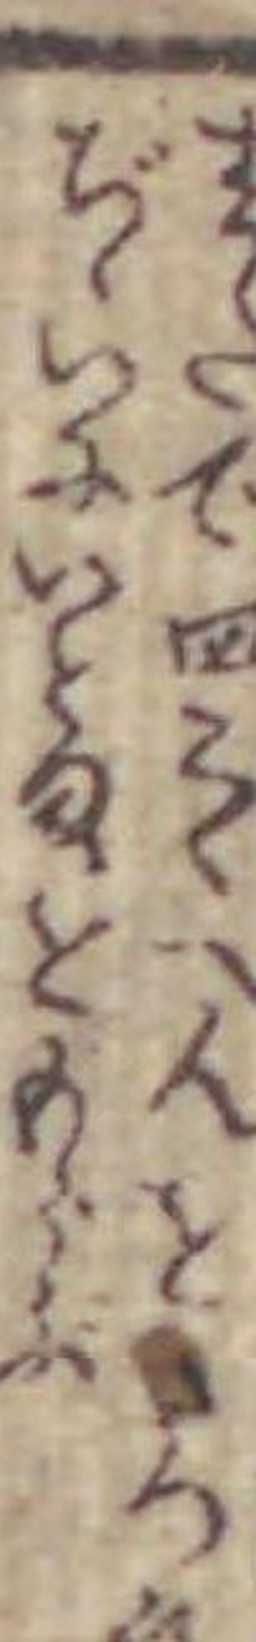ぢゝいにいとまをもらふ
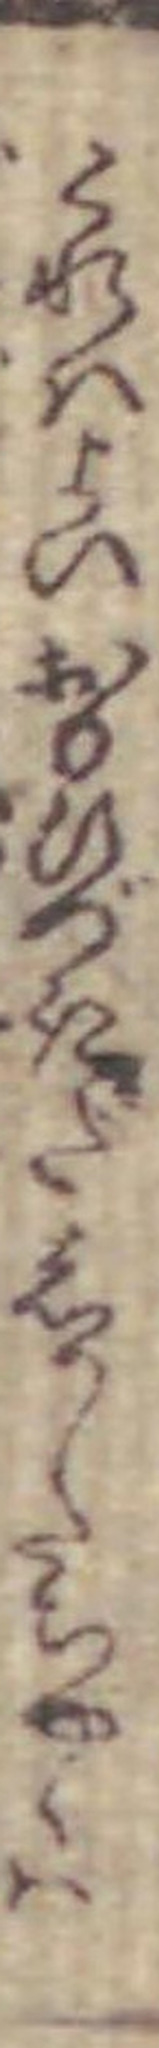これはよいおもひづきだしかしたちやくは
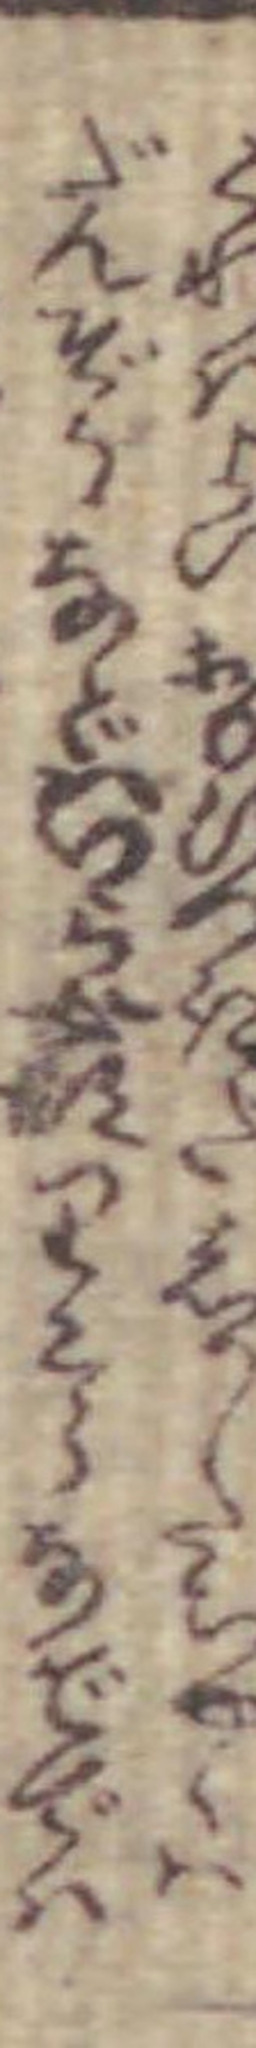だんぞうなどはいら女殿りくらなどでは
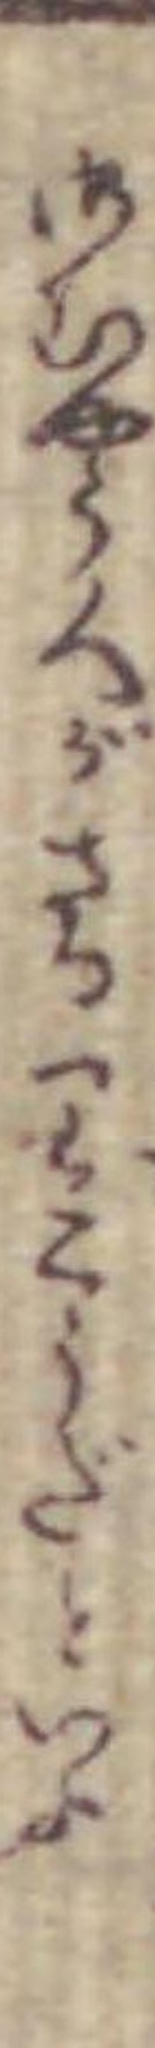ごむやう人がさるこうだといふ
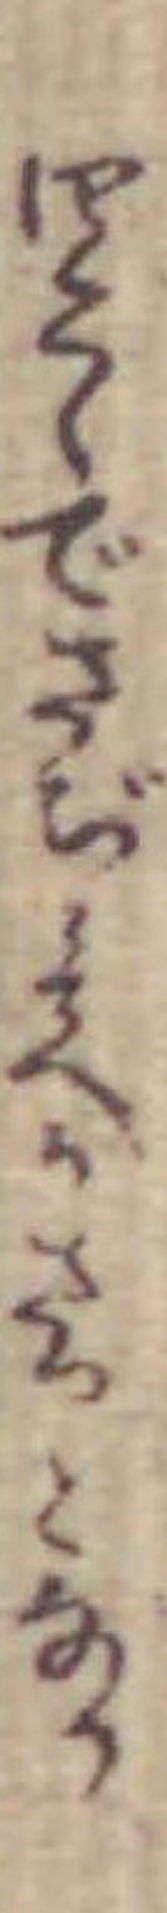四こくでさぢ兵へがさるとなり
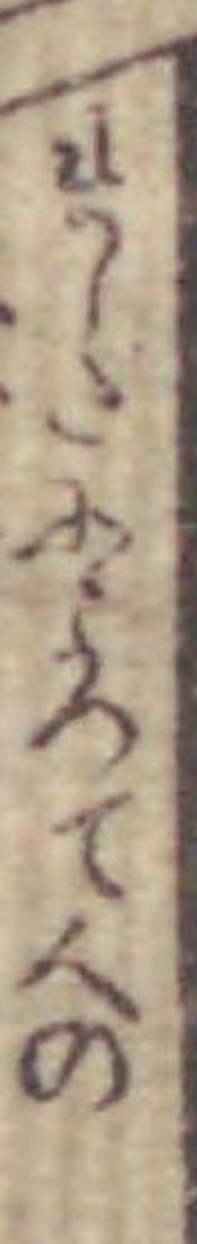ましたによつて人の
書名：交古勢昔咄 : 2巻
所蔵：国立国会図書館 National Diet Library, JAPAN
